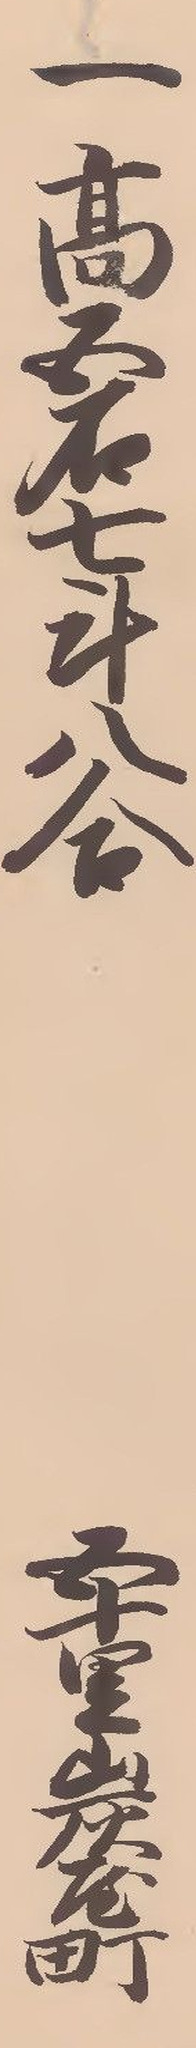一高五石七斗八合五十里炭屋町
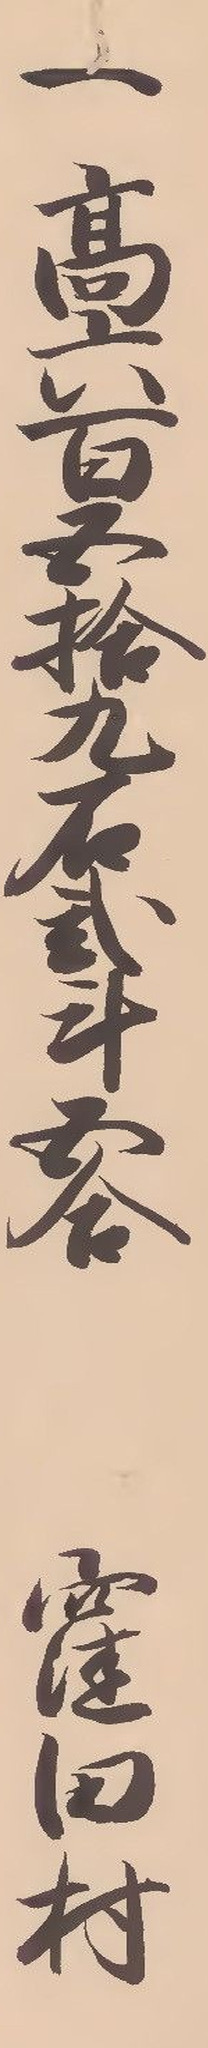一高六百五拾九石弐斗五合窪田村
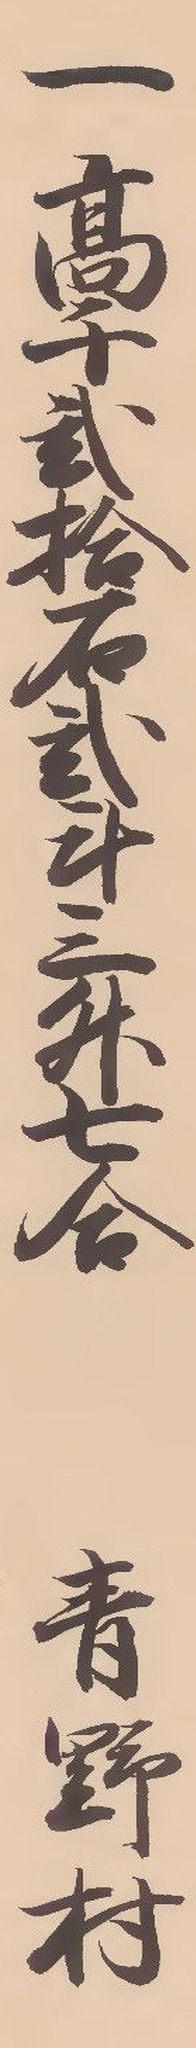一高千弐拾石弐斗三升七合青野村
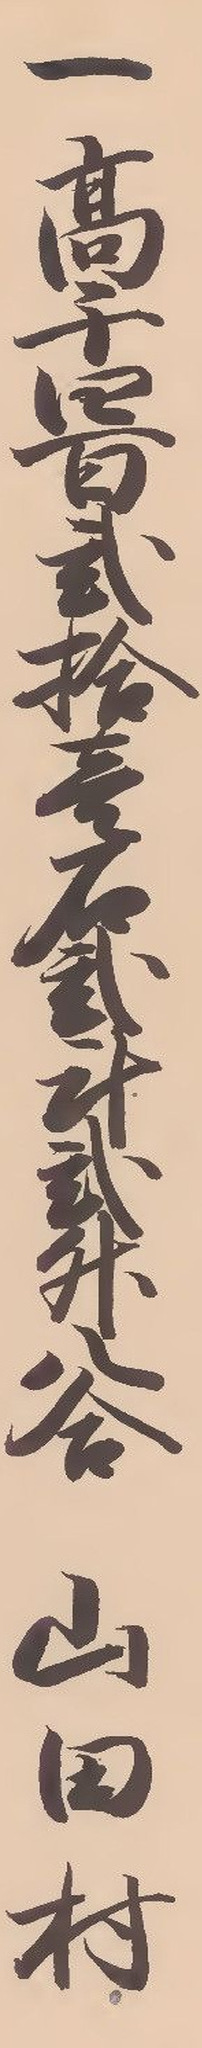一高千四百弐拾壱石弐斗弐升八合山田村
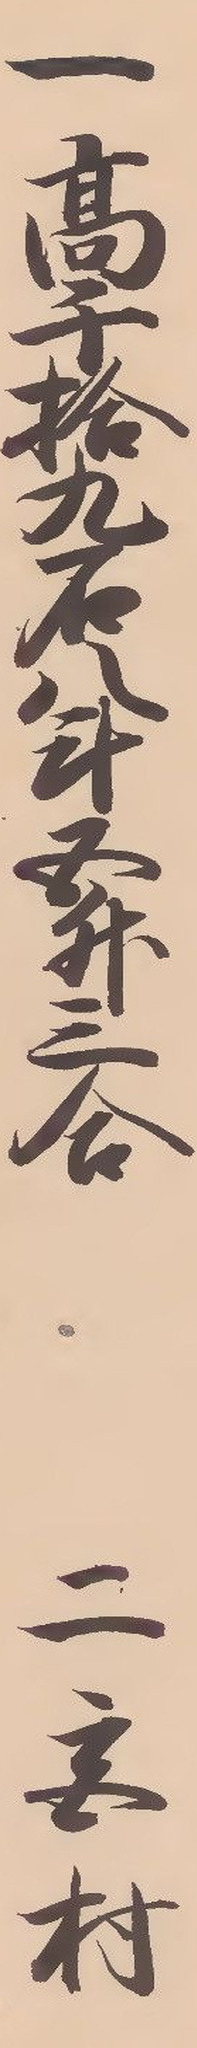一高千拾九石八斗五升三合二宮村

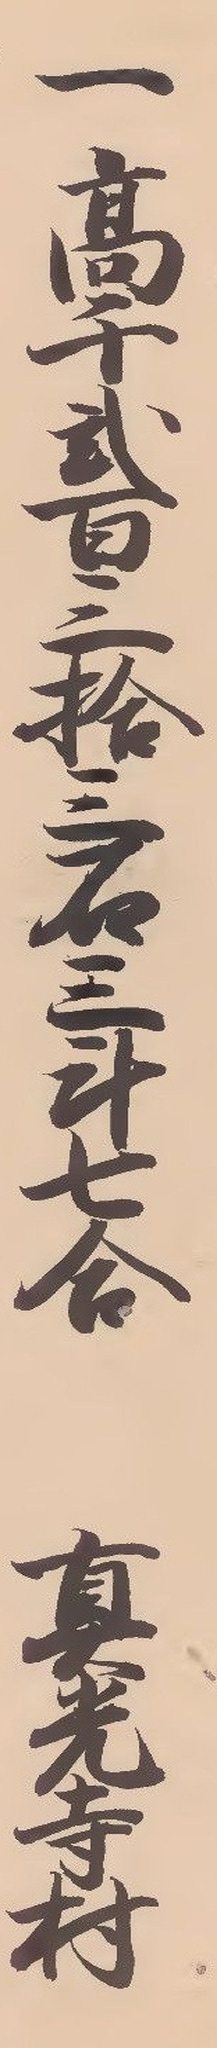一高千弐百三拾三石三斗七合真光寺村
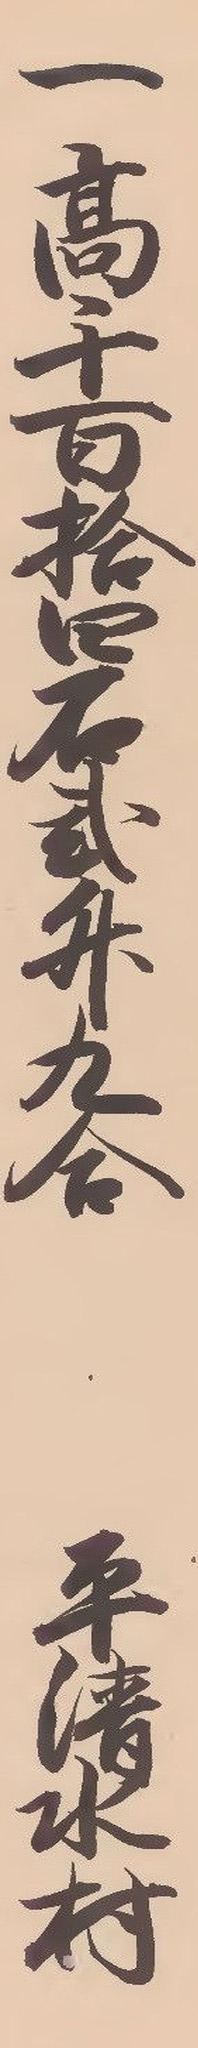一高千百拾四石弐升九合平清水村
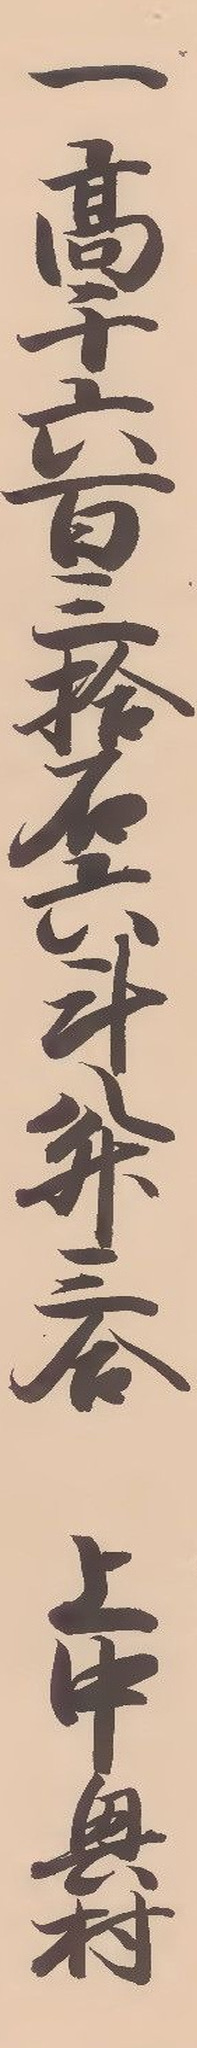一高千六百三拾石六斗八升三合上中興村
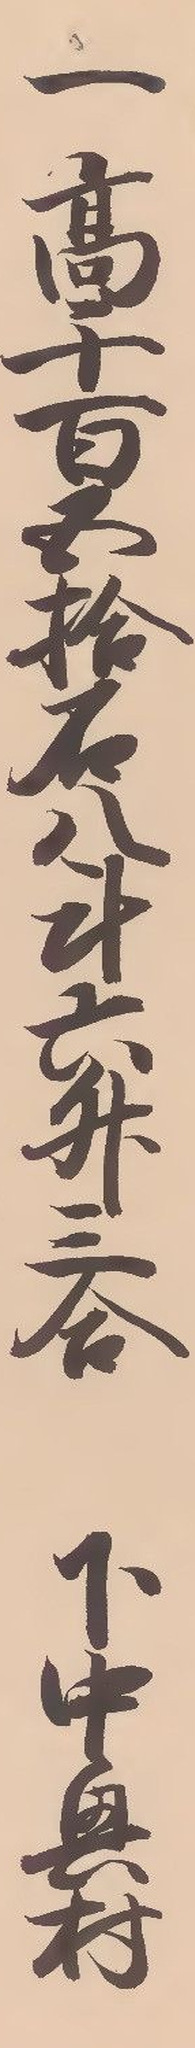一高千百五拾石八斗六升三合下中興村
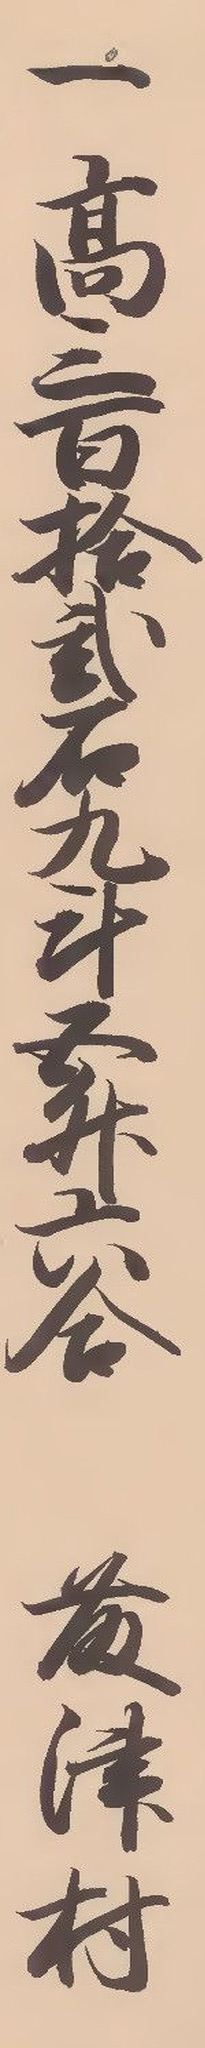一高三百拾弐石九斗五升六合藤津村
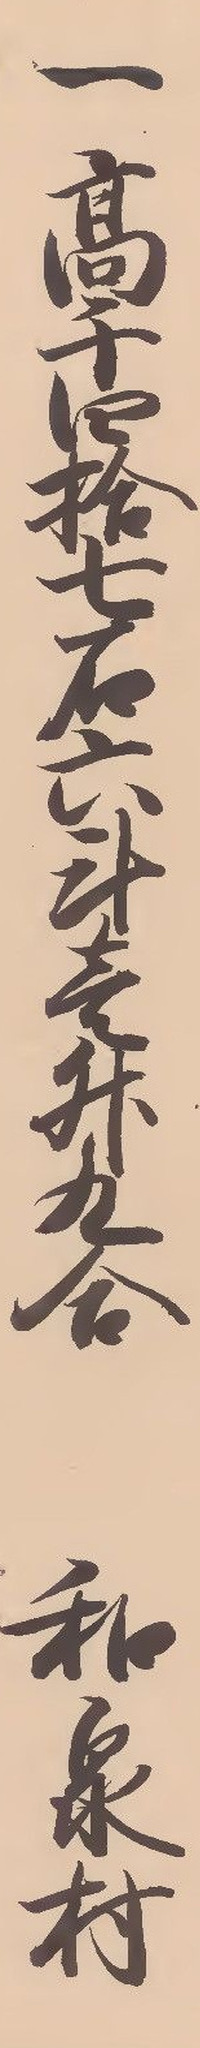一高千四拾七石六斗壱升九合和泉村
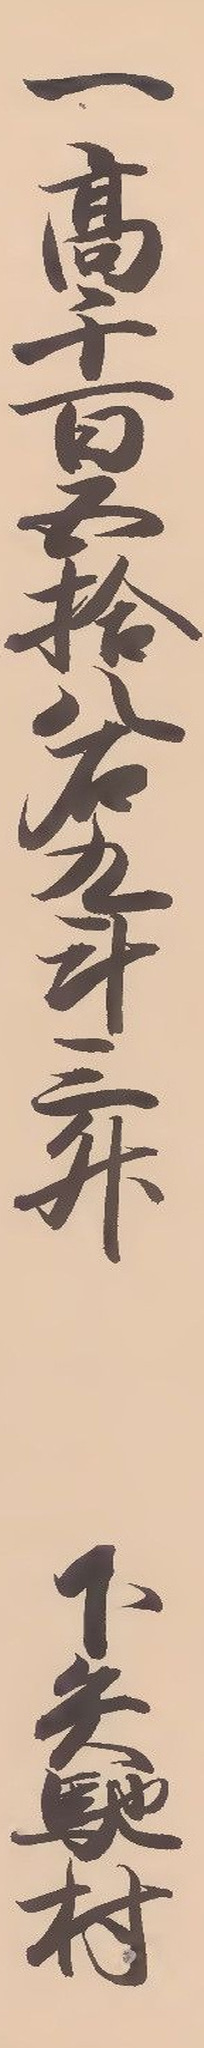一高千百五拾八石九斗三升下矢馳村

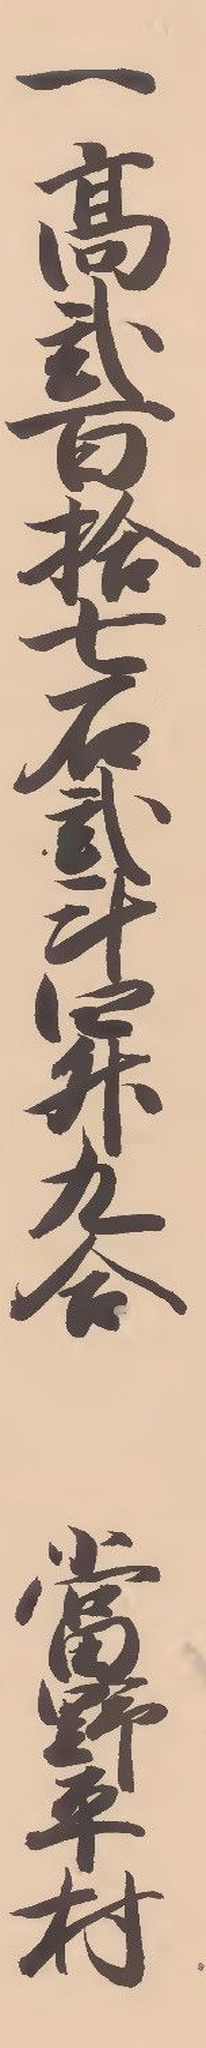一高弐百拾七石弐斗四升九合当野平村
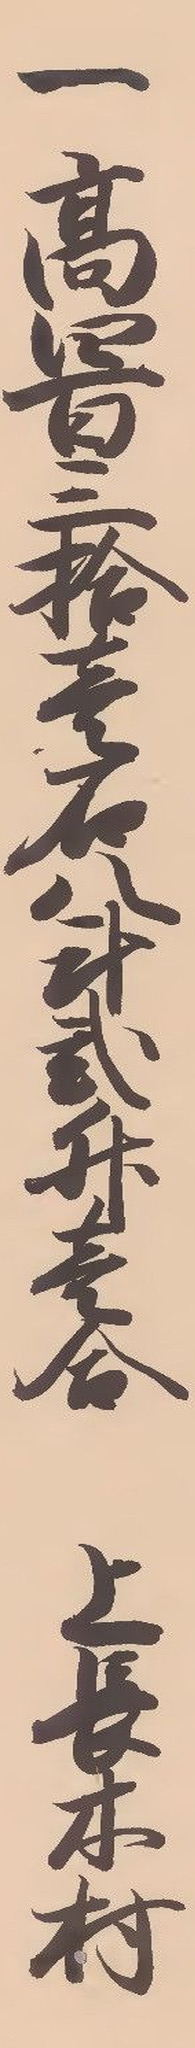一高四百三拾壱石八斗弐升壱合上長木村
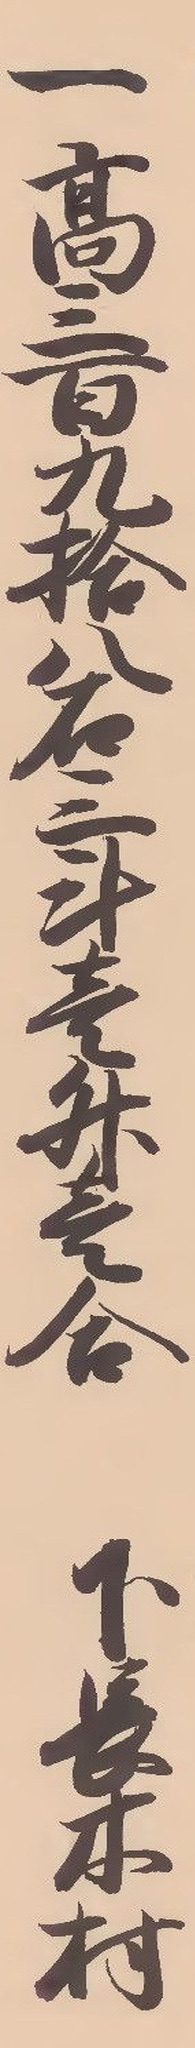一高三百九拾八石三斗壱升壱合下長木村
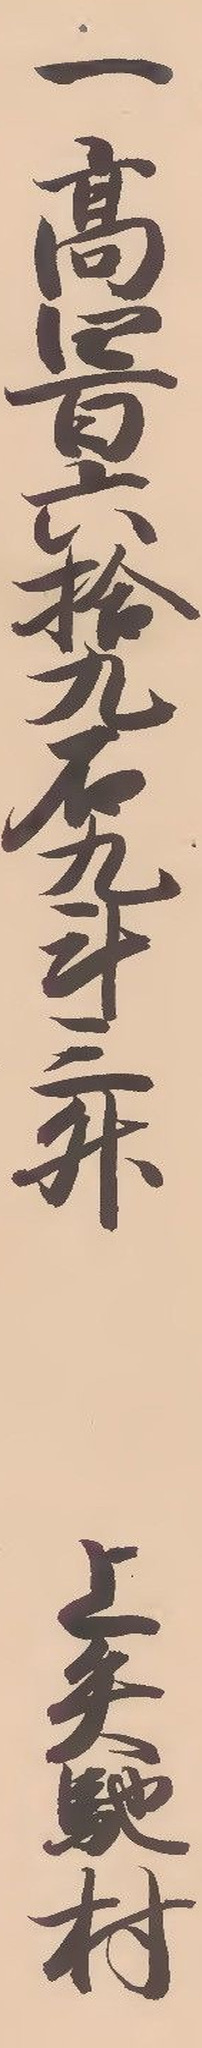一高四百六拾九石九斗三升上矢馳村
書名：佐渡国郷帳
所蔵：国立公文書館 National Archives of Japan
